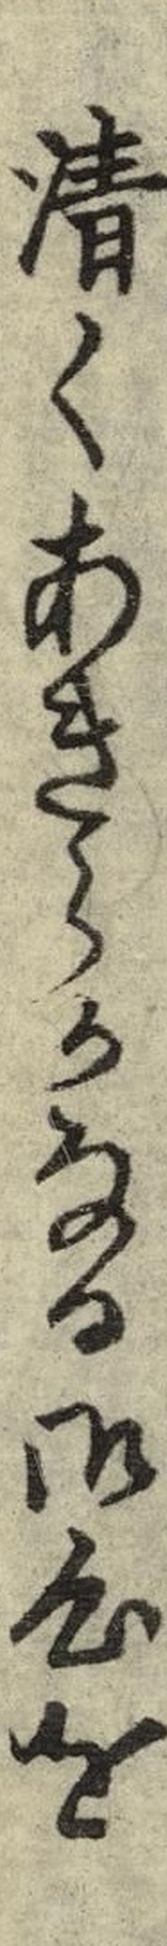清くあきらかなる御心を
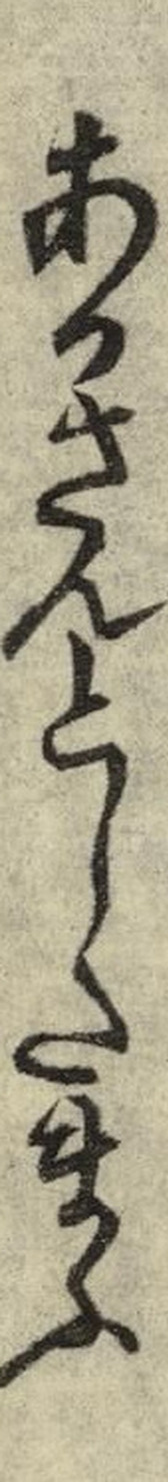あかさんとしたまふ
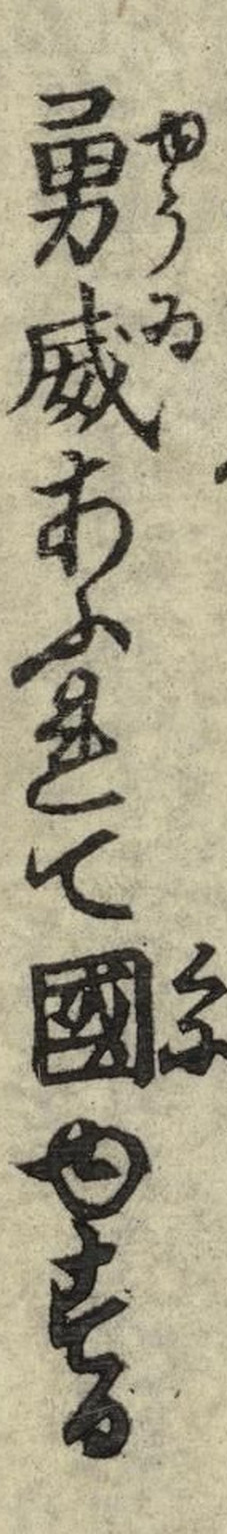勇威あふれて国ゆする

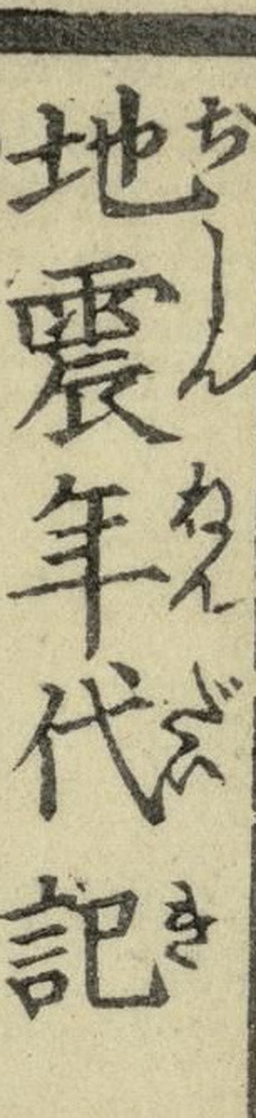地震年代記
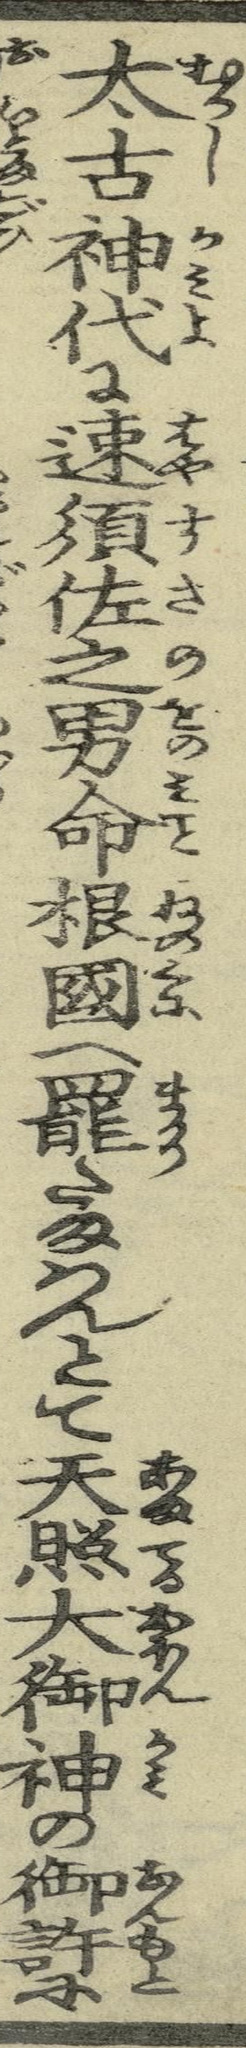太古神代に速須佐之男命根国へ罷たまらんとて天照大御神の御許に
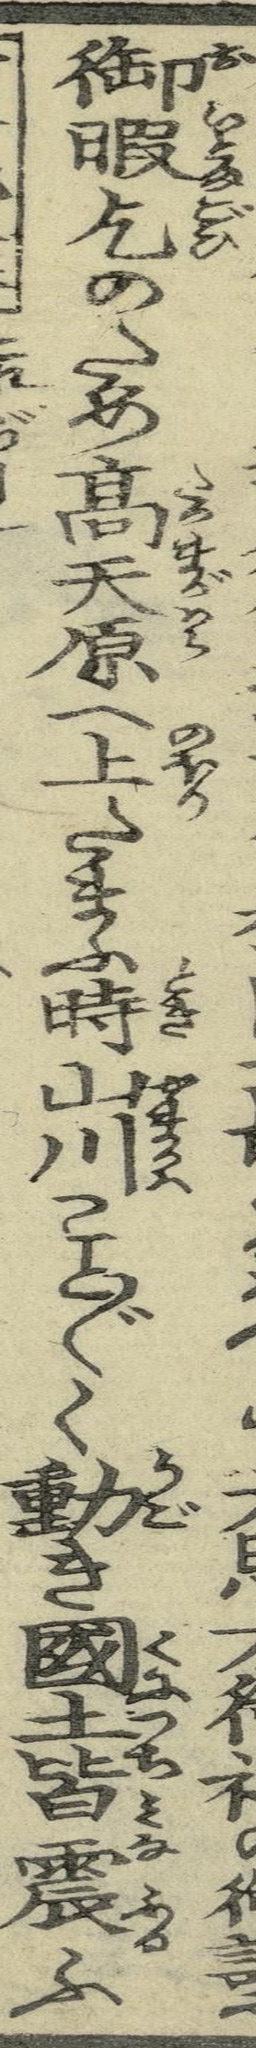御暇乞のため高天原へ上たまふ時山川こと〴〵く動き国土皆震ふ
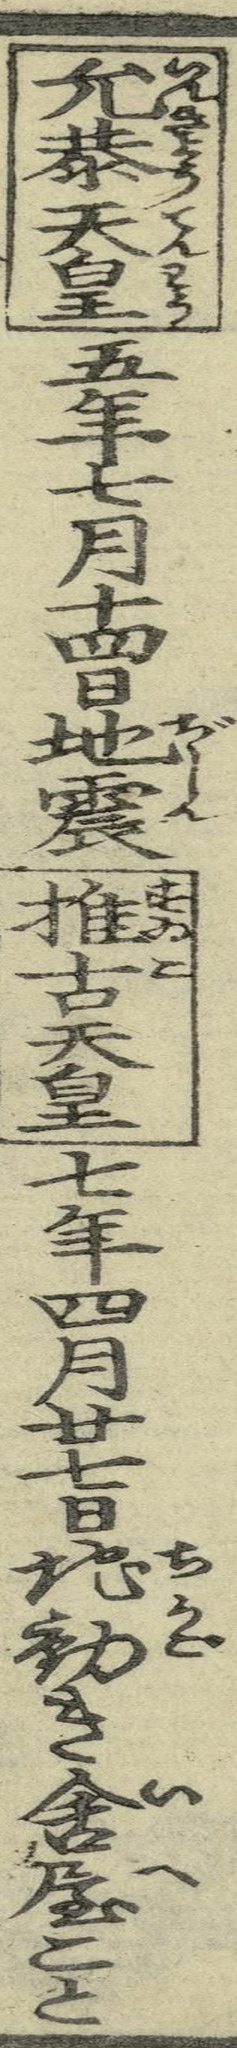允恭天皇五年七月十四日地震推古天皇七年四月廿七日地動き舎屋こと
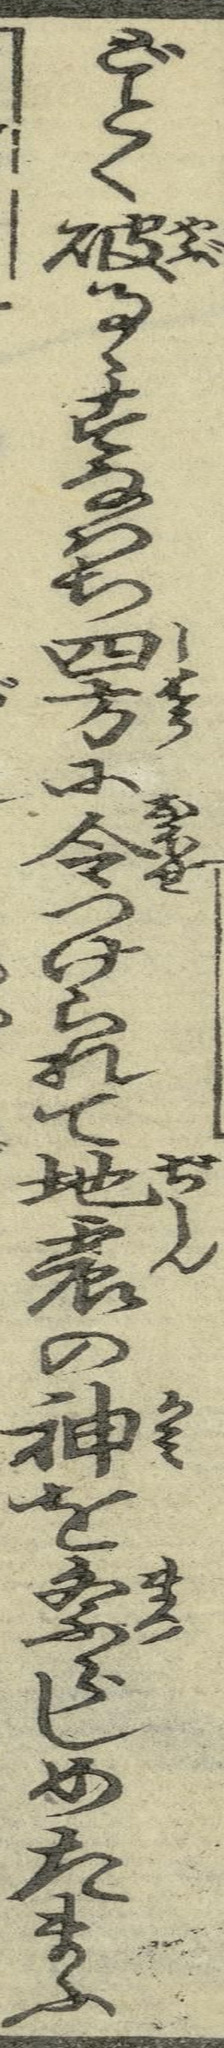ごとく破るゝすなはち四方に令つけれらて地震の神を祭らしめたまふ
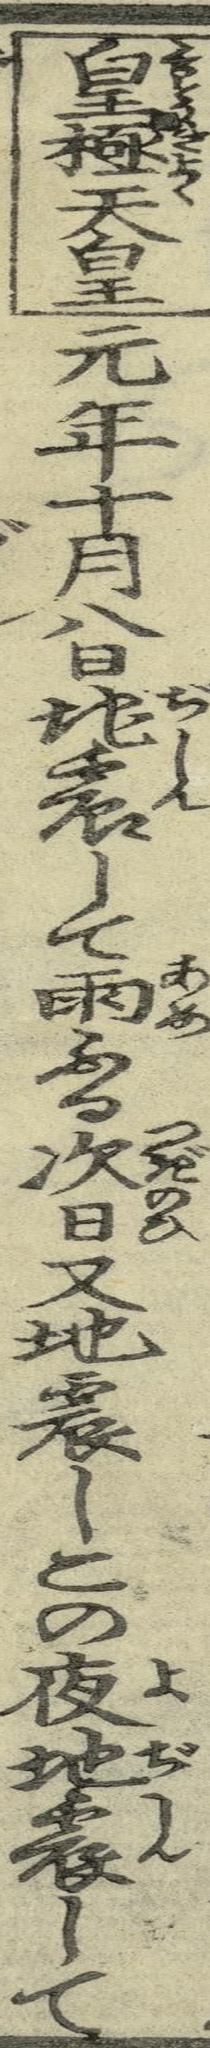皇極天皇元年十月八日地震して雨ふる次日又地震しこの夜地震して
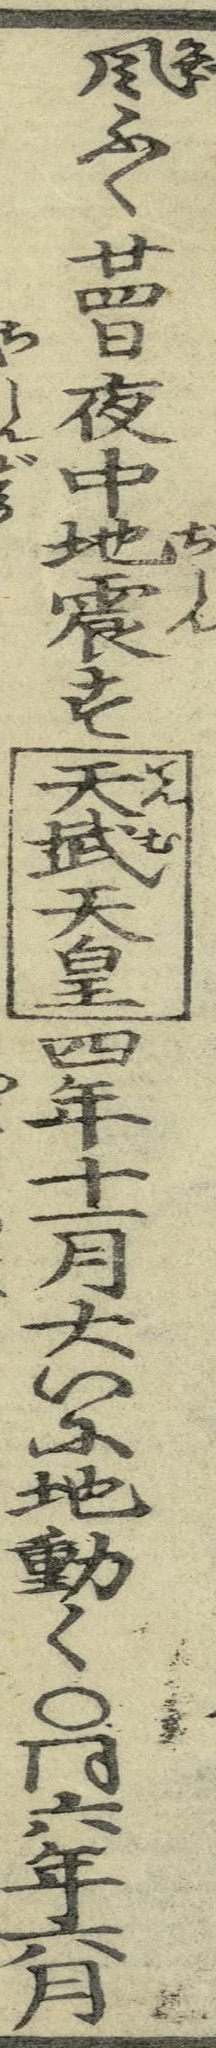風ふく廿四日夜中地震す天武天皇四年十一月大いに地動く◯同六年六月
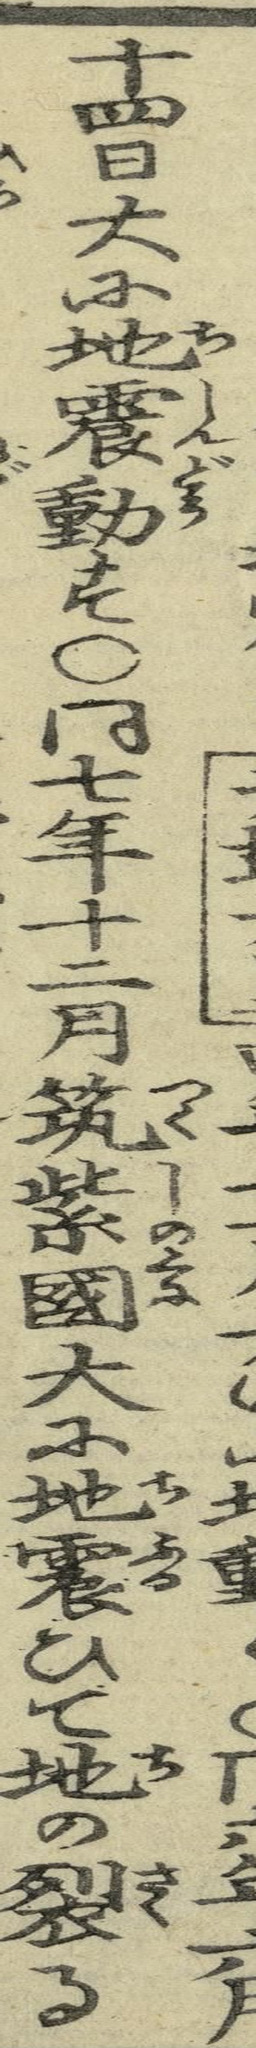十四日大に地震動す◯同七年十二月筑紫国大に地震ひて地の裂る
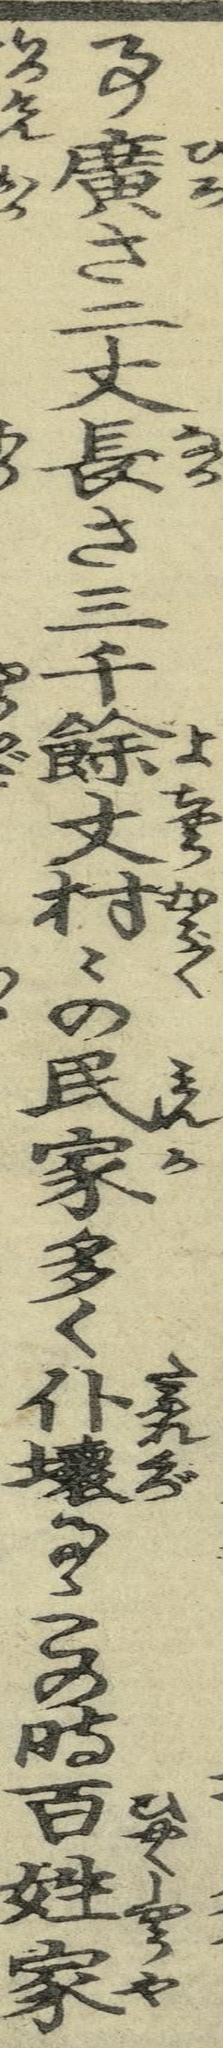事広さ二丈長さ三千余丈村々の民家多く仆壊るゝこの時百姓家
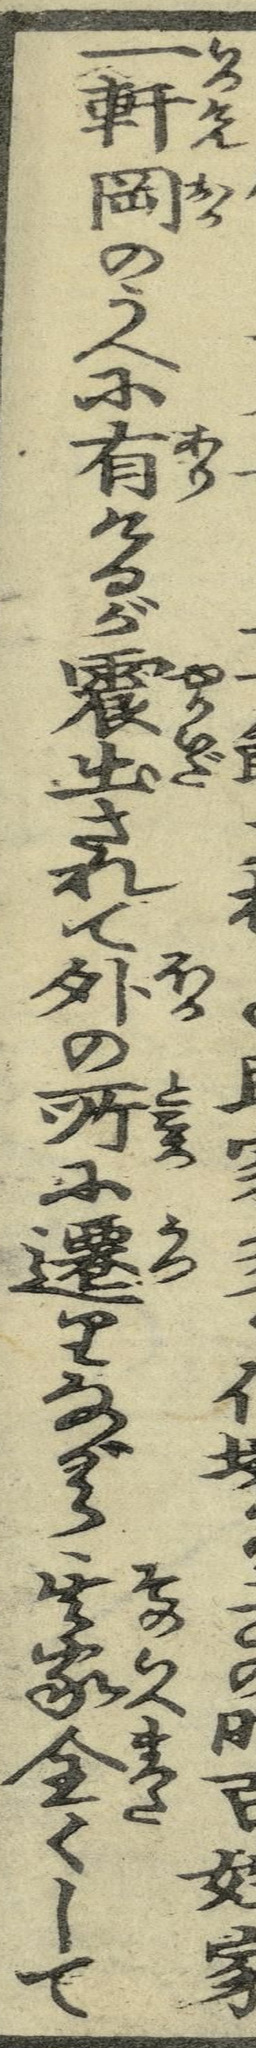一軒岡のうへに有けるが震出されて外の所に遷りながら其家全くして
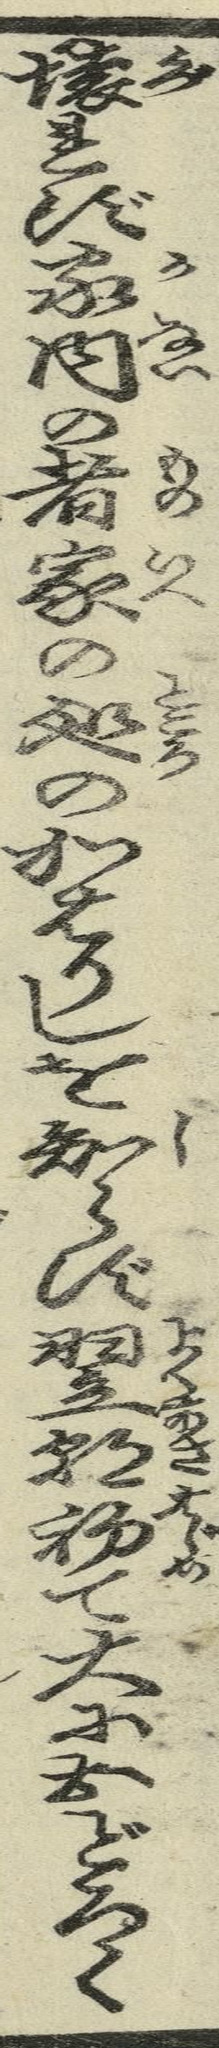壊れず家内の者家の処のかはりしを知らず翌朝初て大におどろく
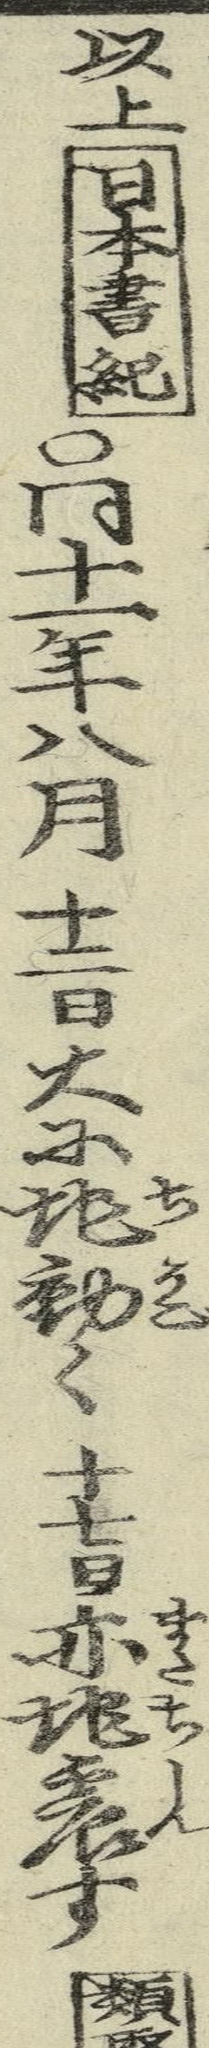以上日本書紀◯同十一年八月十二日大に地動く十七日亦地震す類聚国史
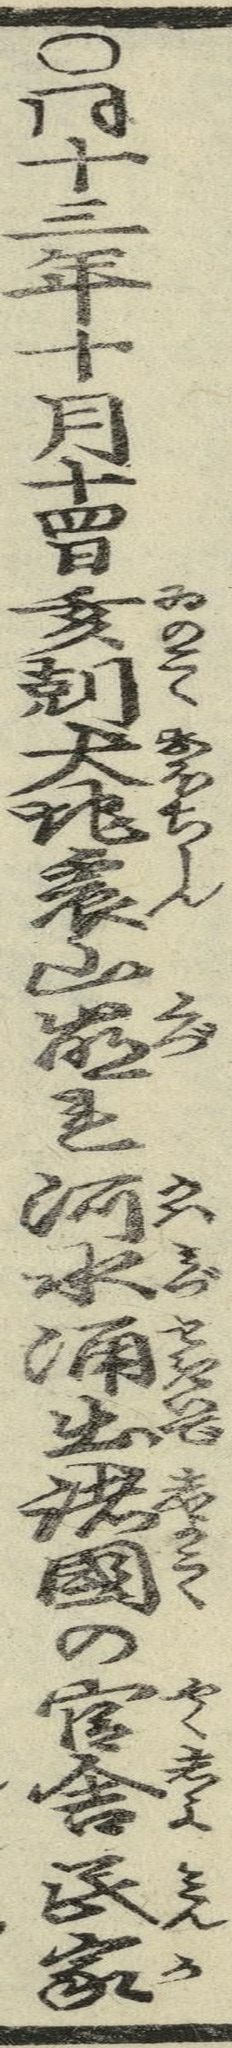◯同十三年十月十四日亥刻大地震山崩れ河水涌出諸国の官舎民家
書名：地震年代記
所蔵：東京大学地震研究所図書室 Earthquake Research Institute Library, The University of Tokyo, JAPAN
